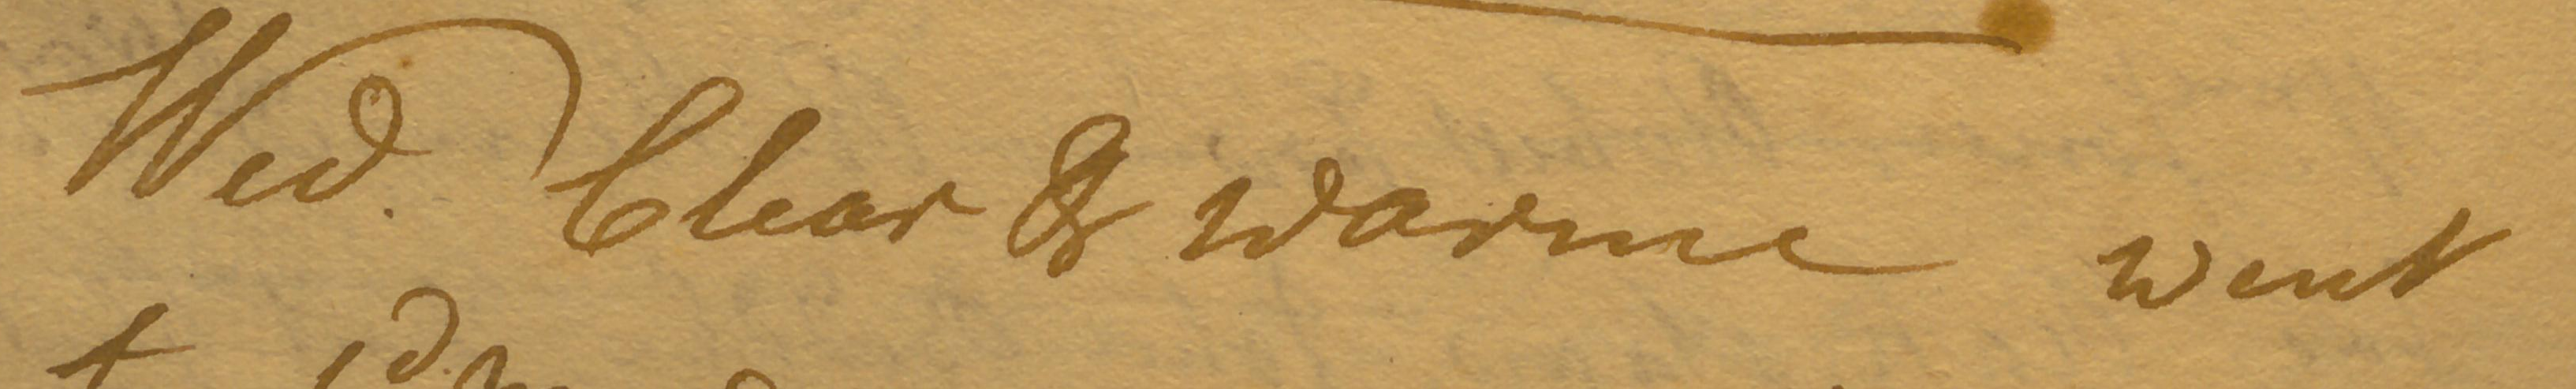Wed. Clear & warme went
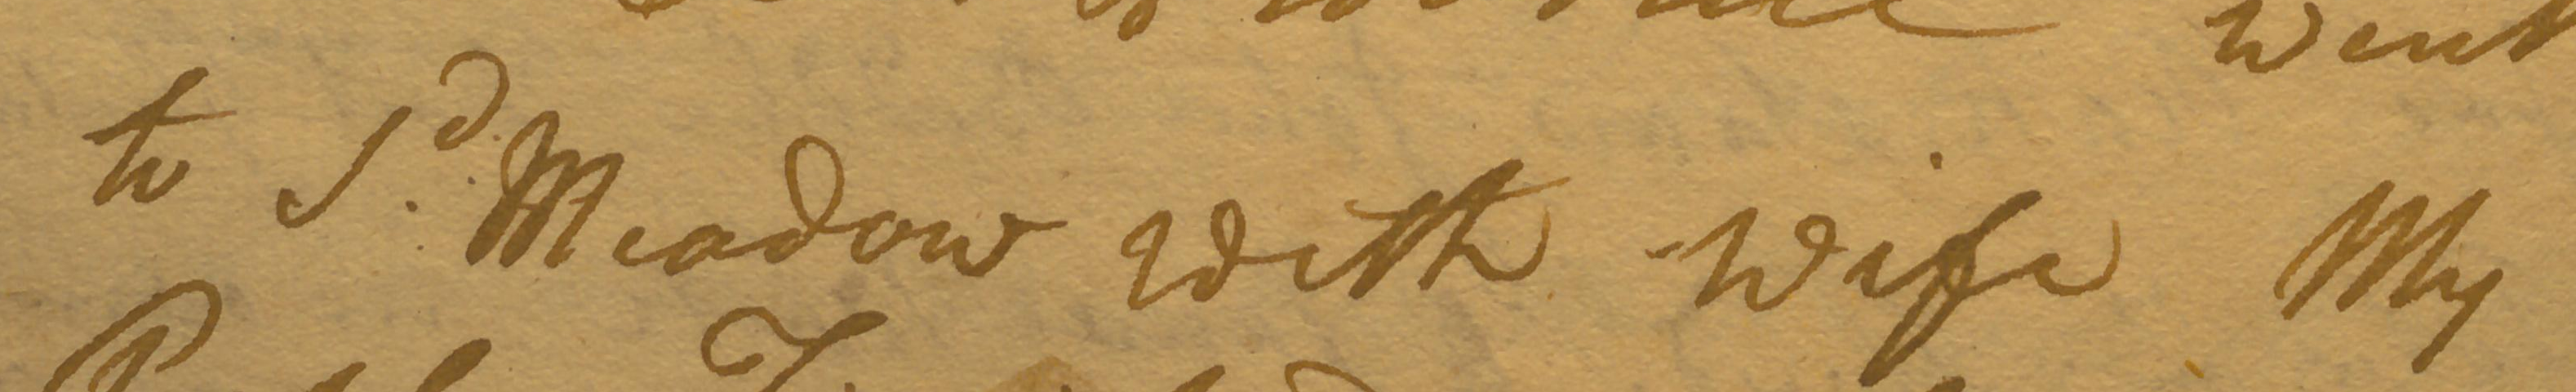to S^d. Meadow with wife, My
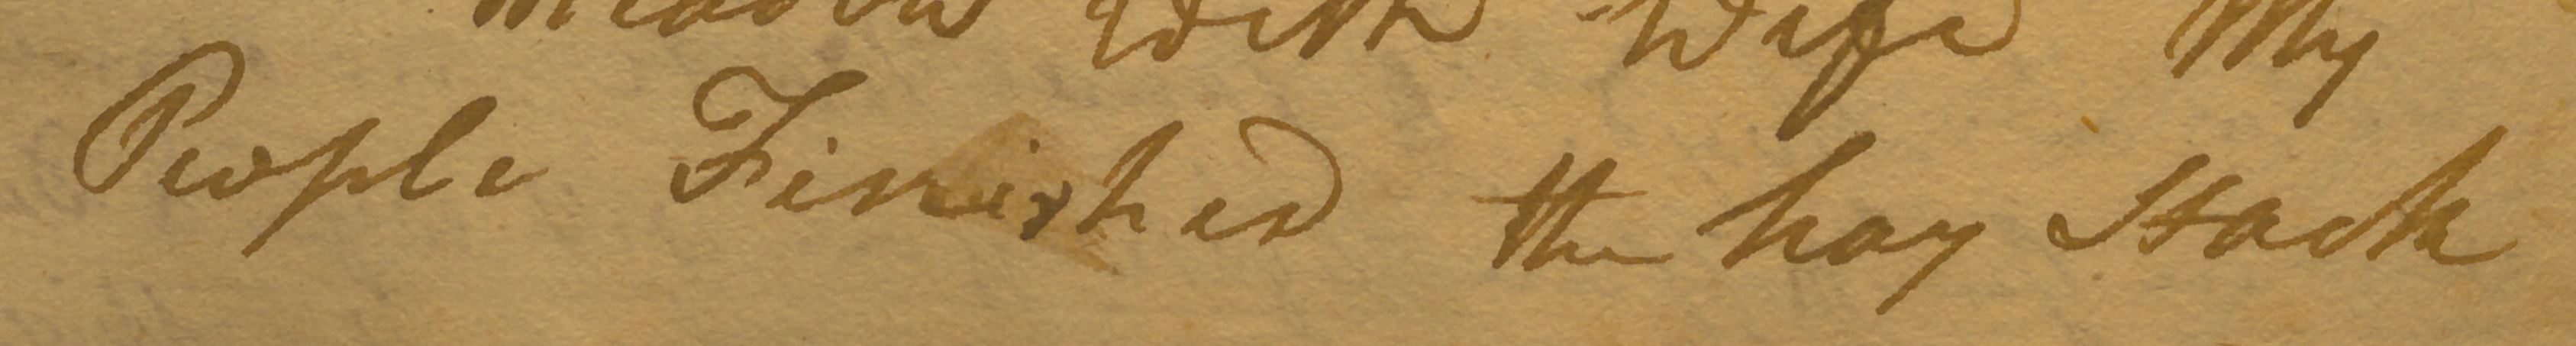People Finished the hay stack
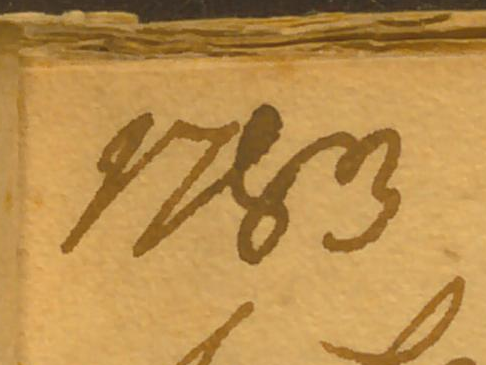1783
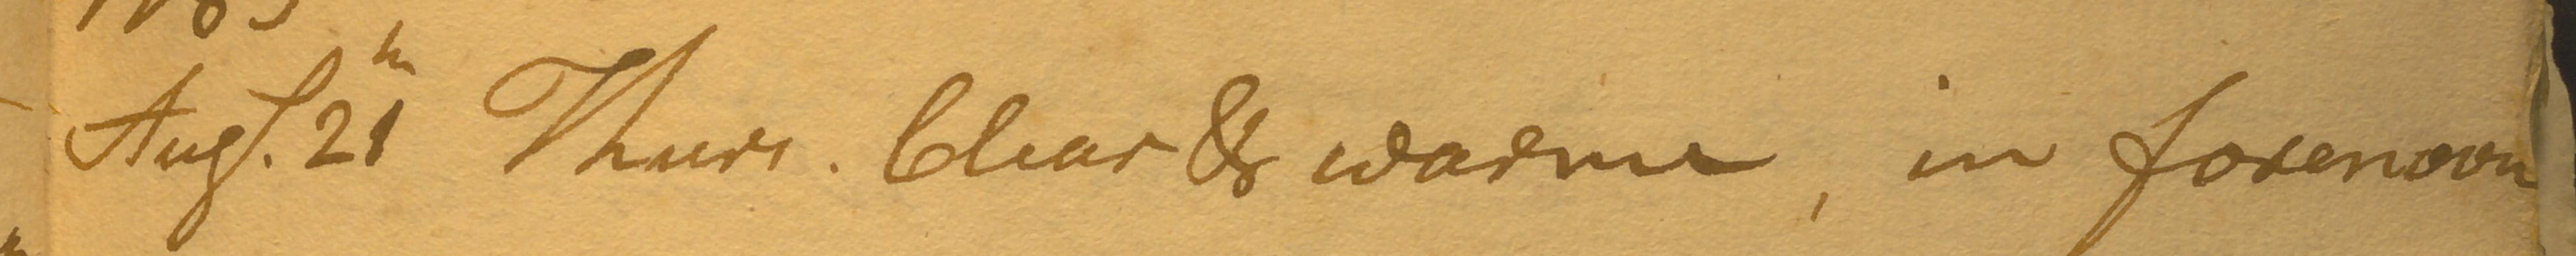Aug^t. 21^th Thurs. Clear & warme in forenoon
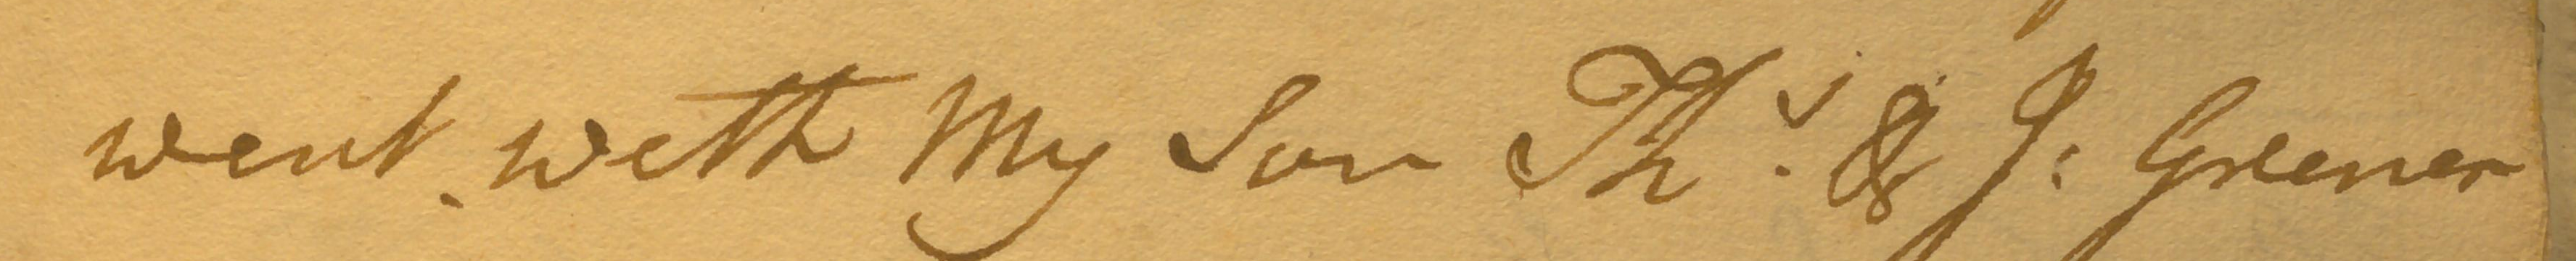went with My Son Th^s. & J: Greener
